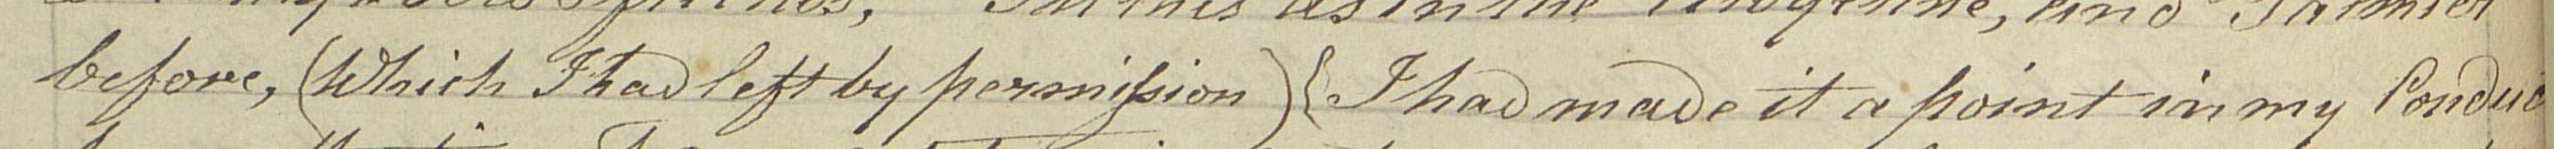before, (Which I had left by permission) (I had made it a point in my Conduct
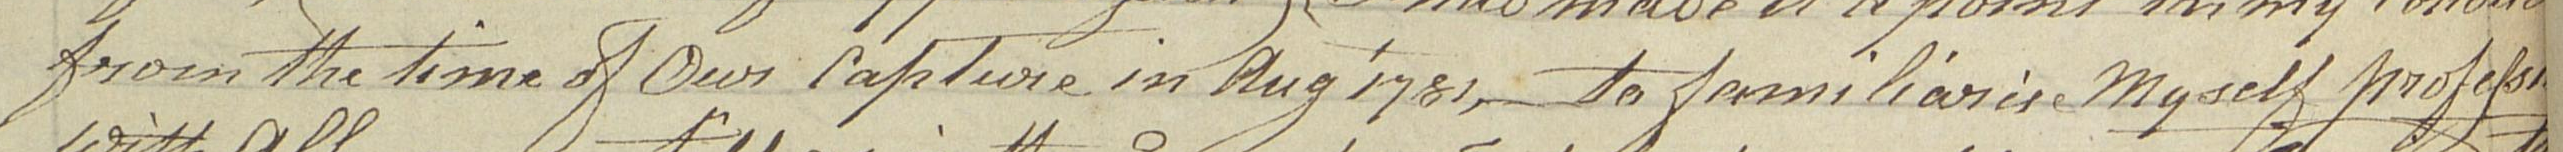from the time of Our Capture in Aug^t 1781, to familiarise Myself Profess-
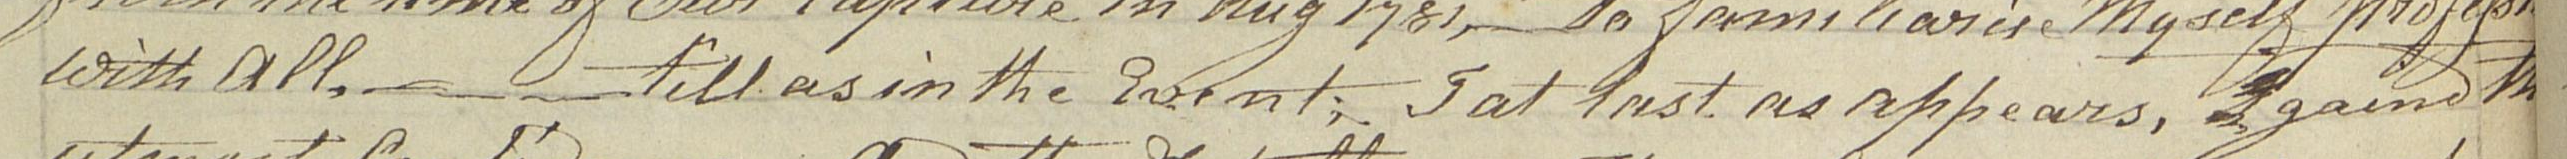with All, till as in the Event; I at last as appears, gaind th-
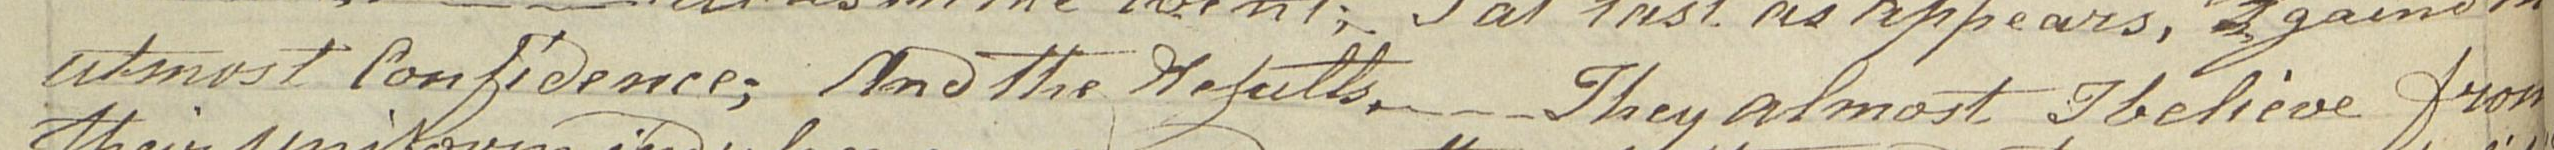utmost confidence; and the Results, They almost I believe from
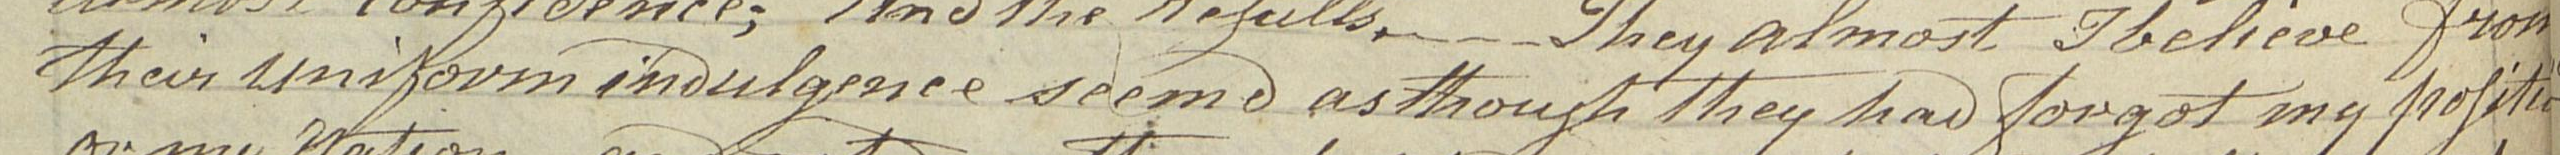their uniform indulgence seemd as though they had forgot my position
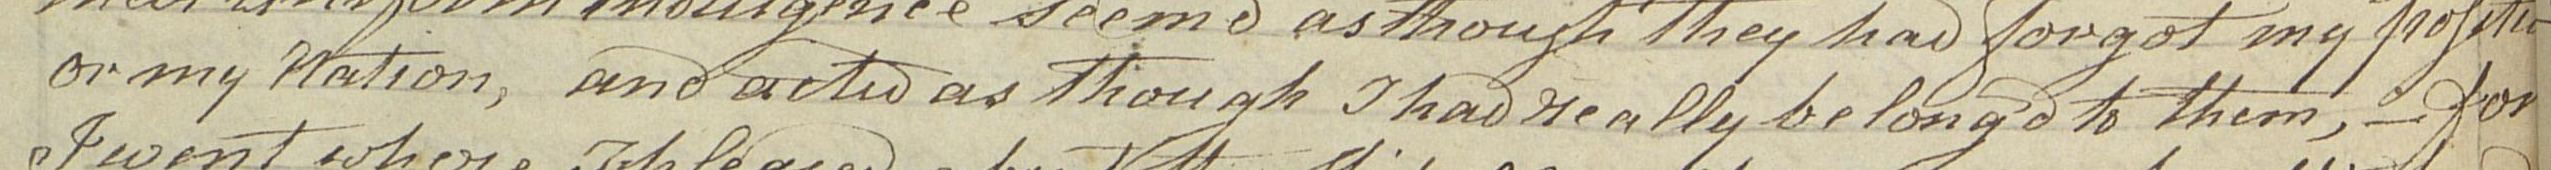or my nation, and acted as though I had really belongd to them, for
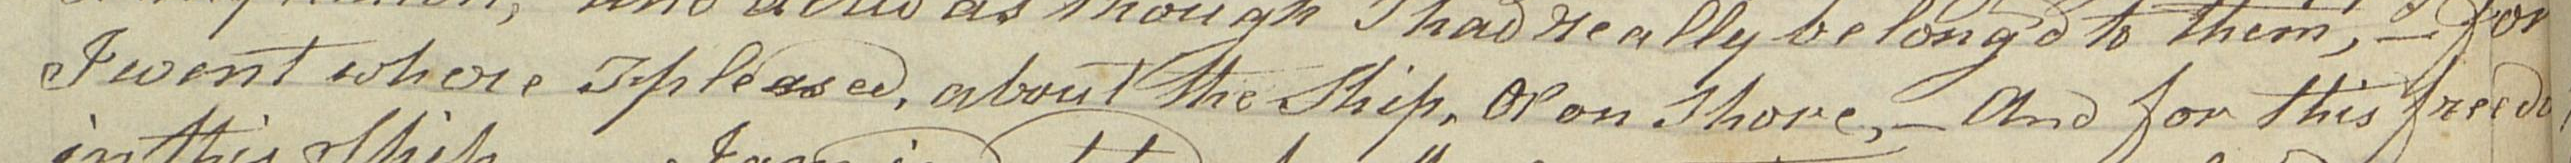I went where I pleased, about the Ship, Of on Shore, And for this freed-
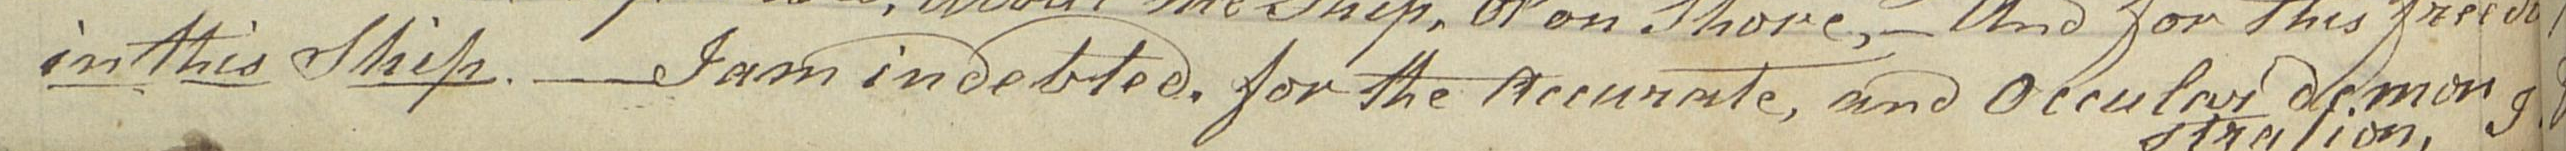in this Ship I am indebted. for the accurate, and occular demon
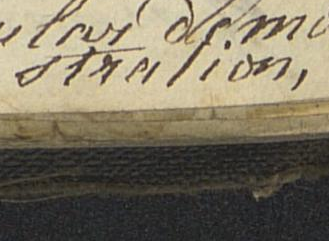stralion, I
